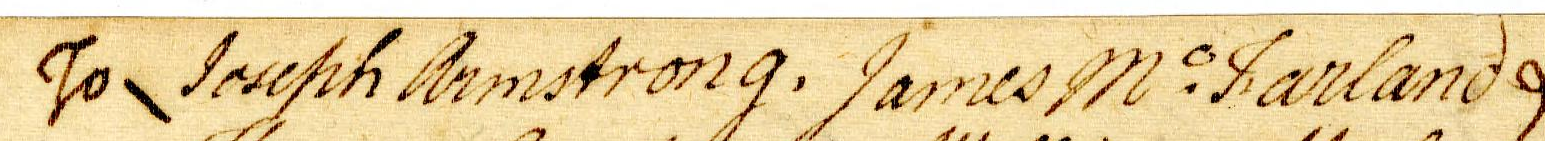To Joseph Armstrong, James M^c.Farland
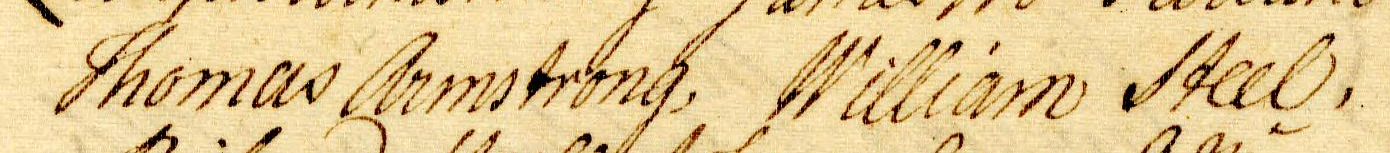Thomas Armstrong, William Steel,
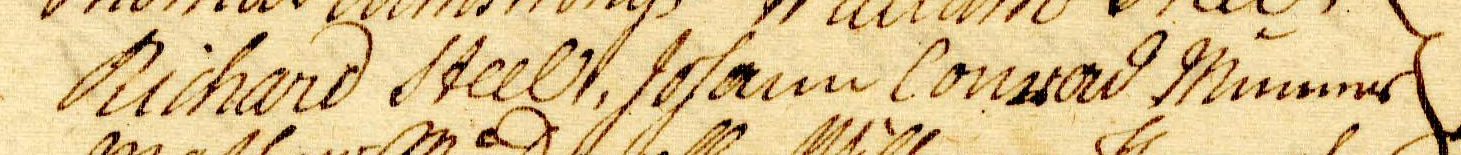Richard Steel, Josaiam Coroud Minner
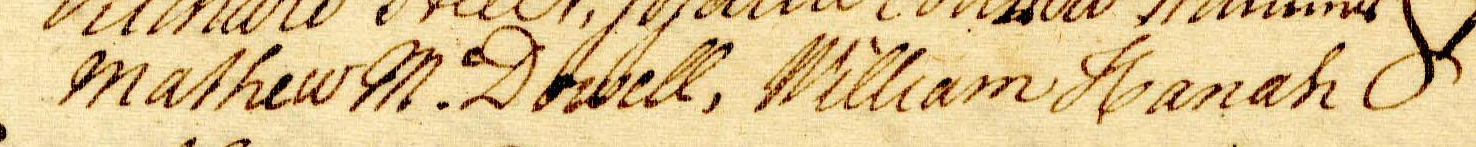Mathew M. Dowell, William Hanah
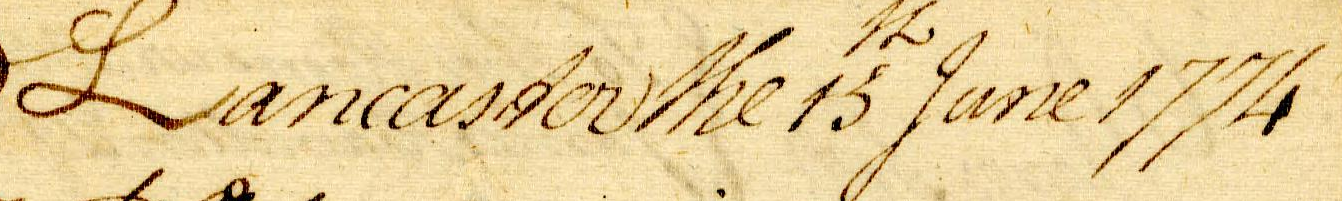Lancaster the 15^th June 1774
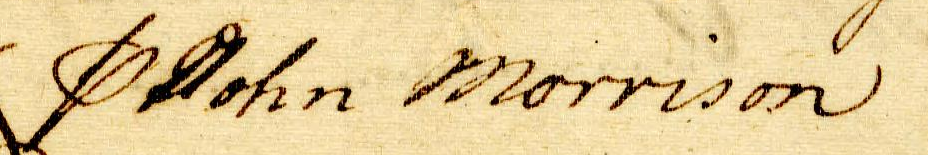per John Morrison
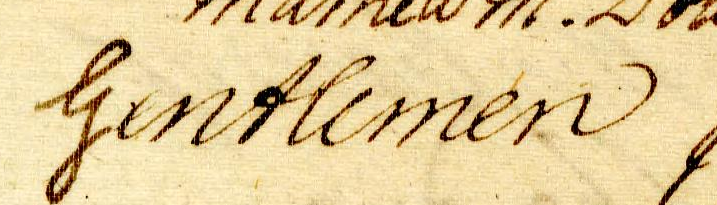Gentlemen
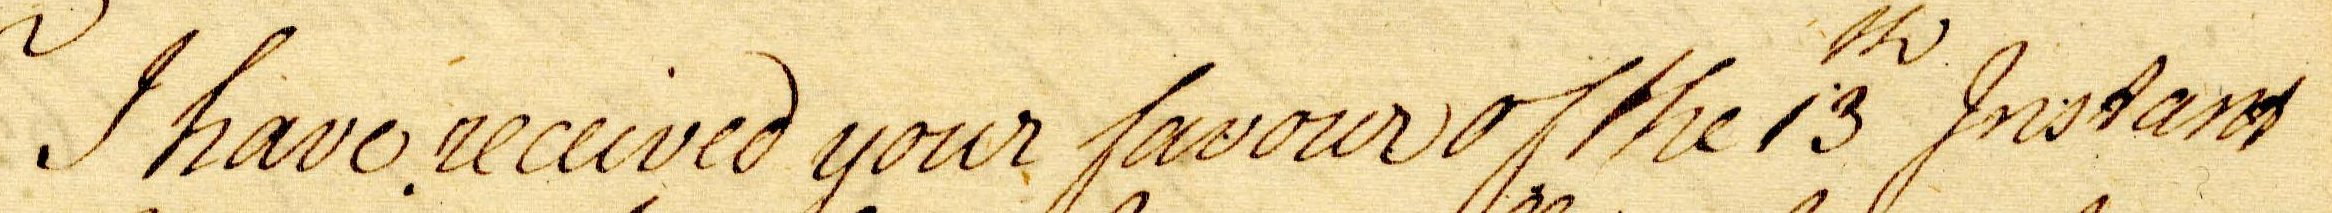I have received your favour of the 13^th Instant
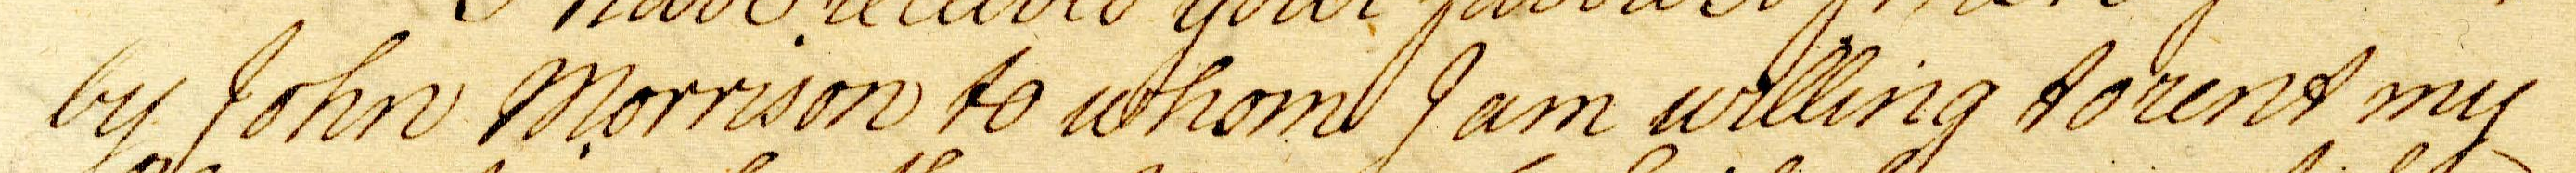by John Morrison to whom I am willing so rent my
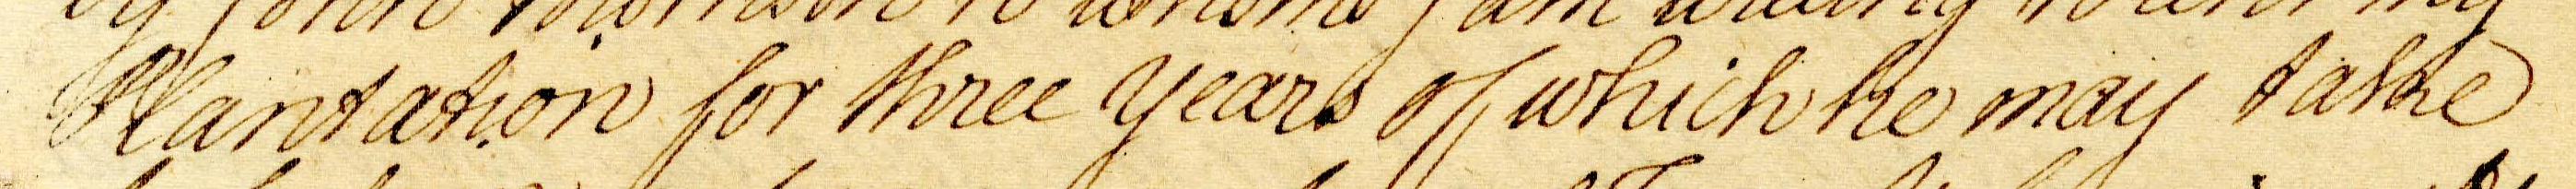Plantation for three years of which he may take
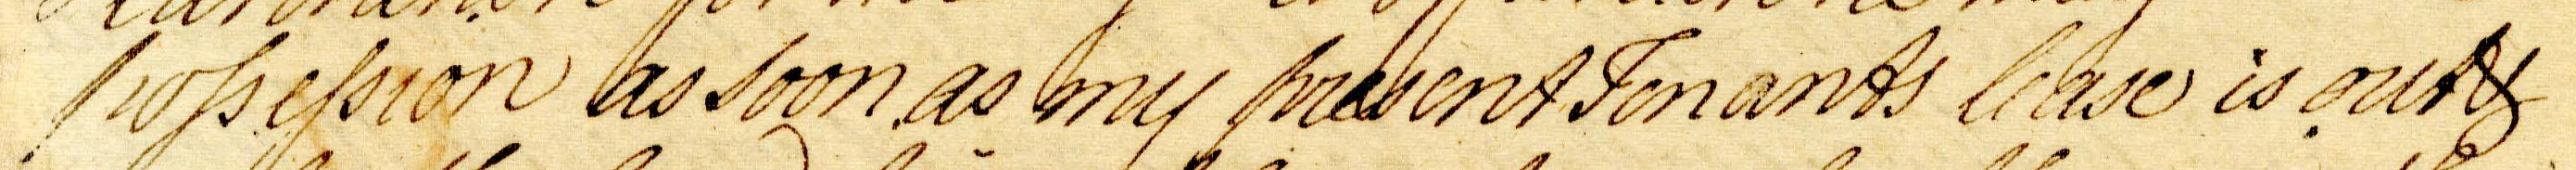possession as soon as my present Tenants lease is out &
